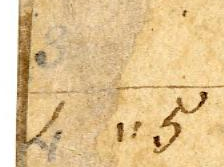4..5
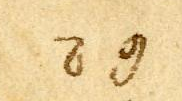62
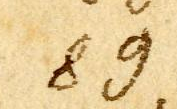68
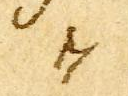4
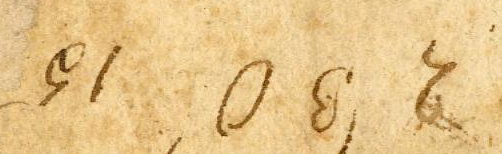2 30 15
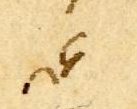5
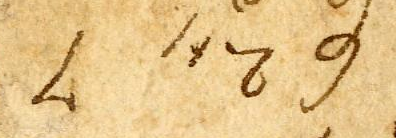62.. 7
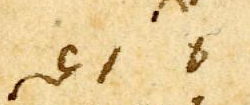1 15
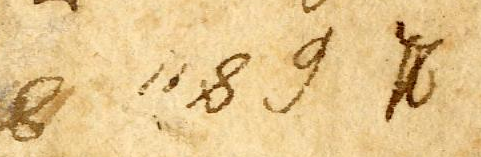[2] 68.. 8
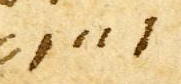1.. 15
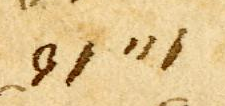1.. 15
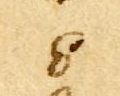3
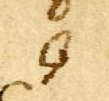5
